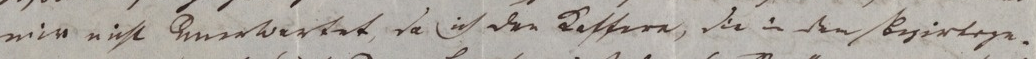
mir nicht unerwartet, da ich den Kaffern, die in dem Bezriksge-
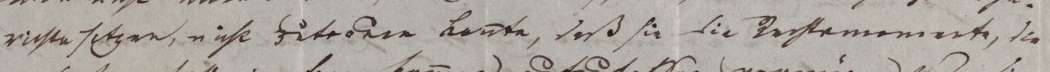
richten sitzen, nicht zutrauen konnte, daß sie die Rechtsmomente, die
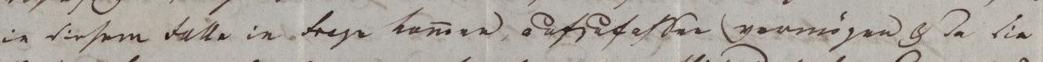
in diesem Falle in frage kommen, aufzufassen vermögen & da die
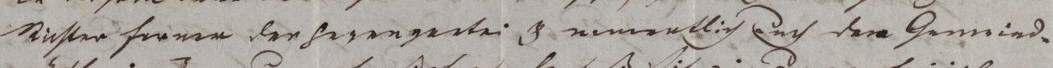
Richter ferner der Gegenpartei & namentlich auch den Gemeind-
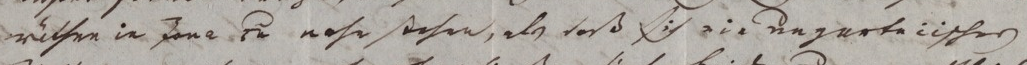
räthen in Jona zu nahe stehen, als daß sich ein unparteiisches
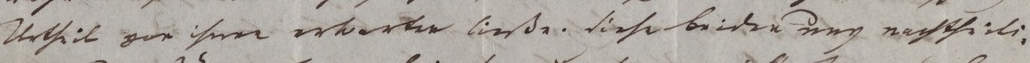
Urtheil von ihnen erwarten ließe. Diese beiden uns nachtheili-
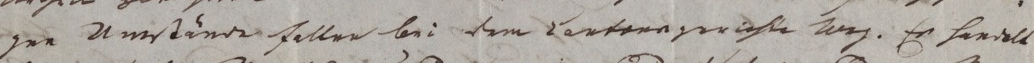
gen Umstände fallen bei dem Kantonsgerichte weg. Es handelt
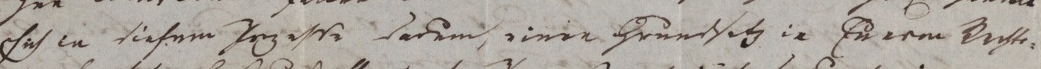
sich in diesem Prozesse darum, einen Grundsatz in Euerm Rechts-
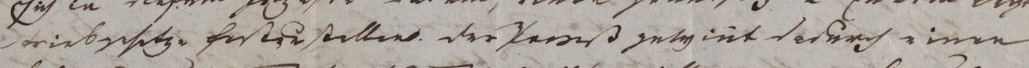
triebsgesetze festzustellen. Der Prozeß gewinnt dadurch einen
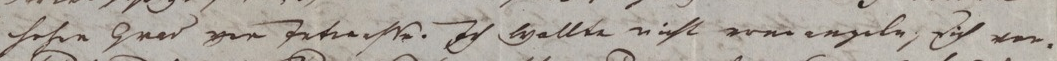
hohen Grad von Interesse. Ich wollte nicht ermangeln, dich vor-
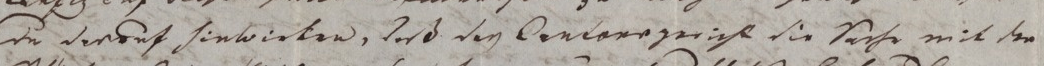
du darauf hinwirken, daß das Cantonsgericht die Sache mit der
